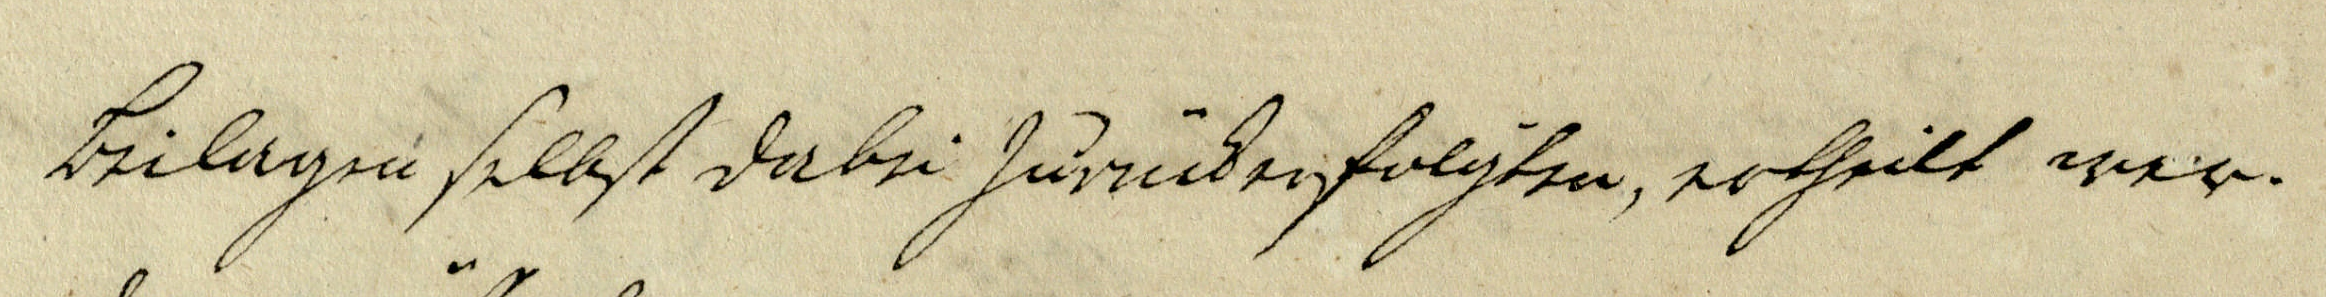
Beilagen selbst dabei zurückerfolgten, ertheilt wer¬
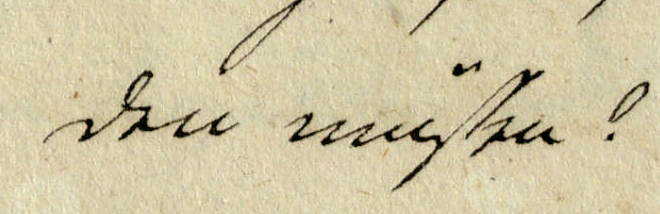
den müssen?
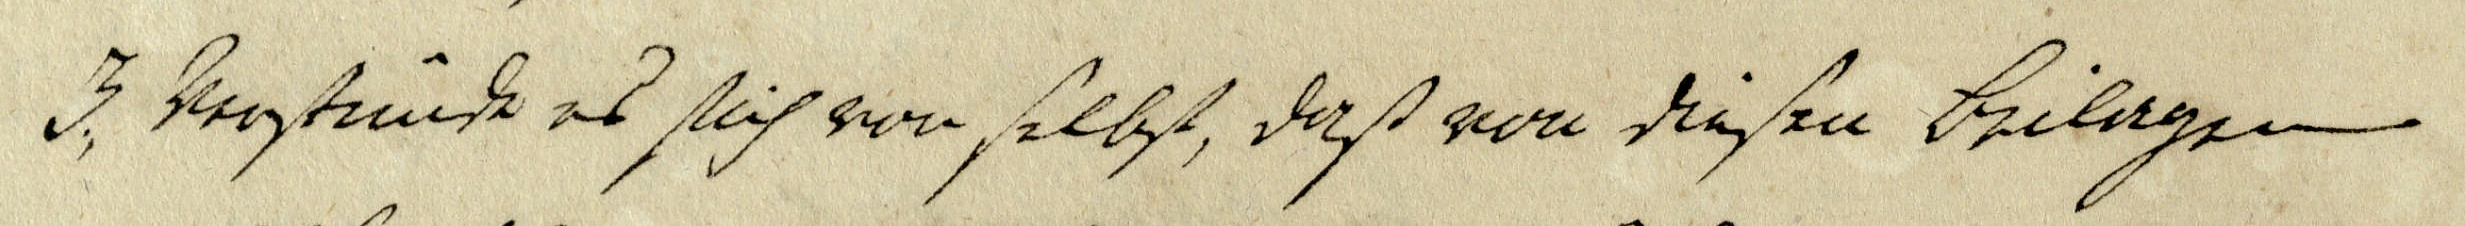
3, Verstünde es sich von selbst, daß von diesen Beilagen
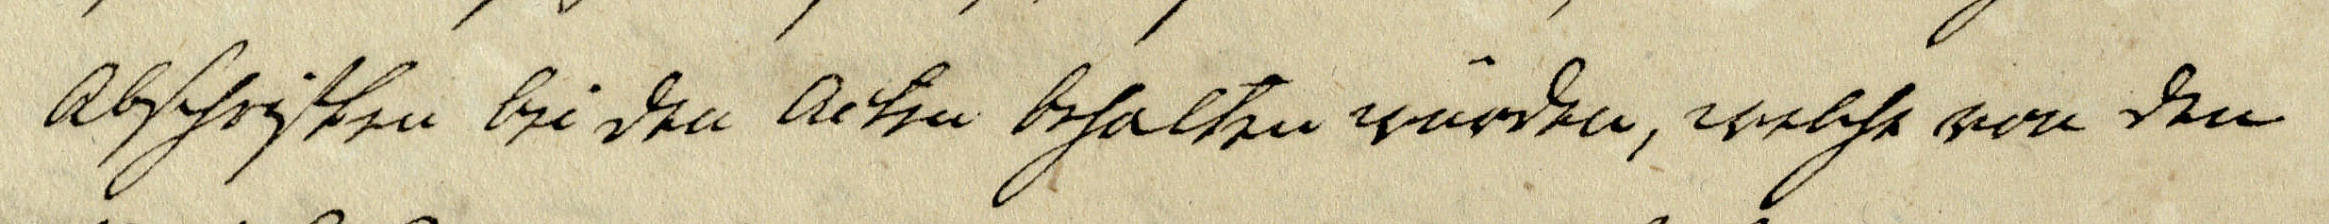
Abschriften bei den Acten behalten würden, welche von den
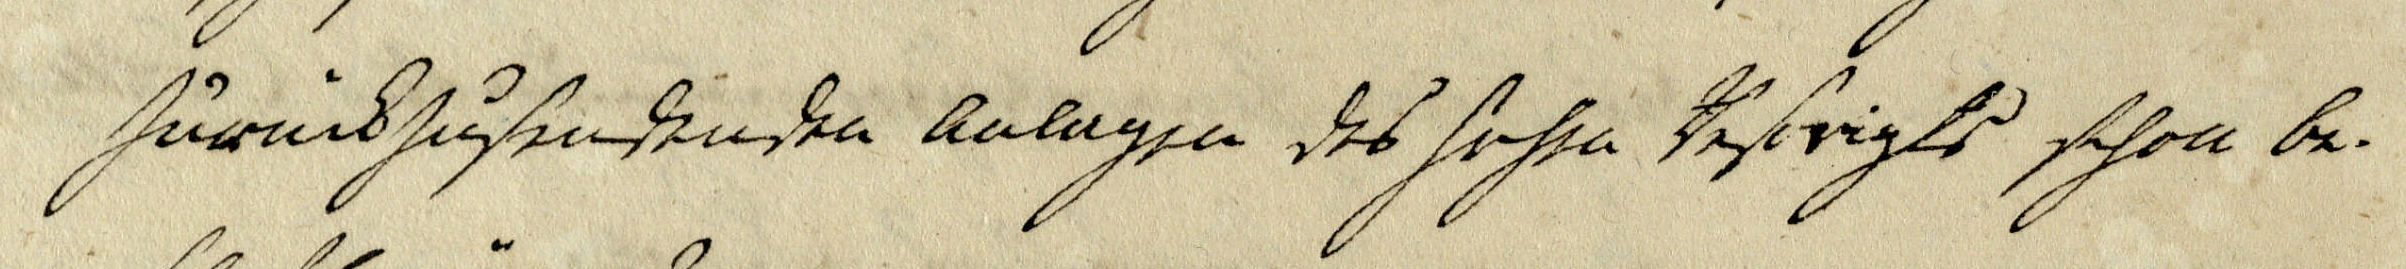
zurückzusendenden Anlagen des hohen Rescripts schon be¬
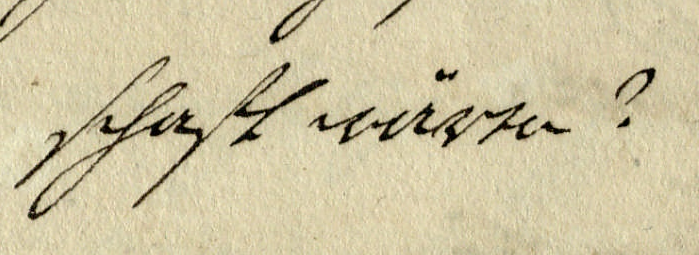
schaft wären?
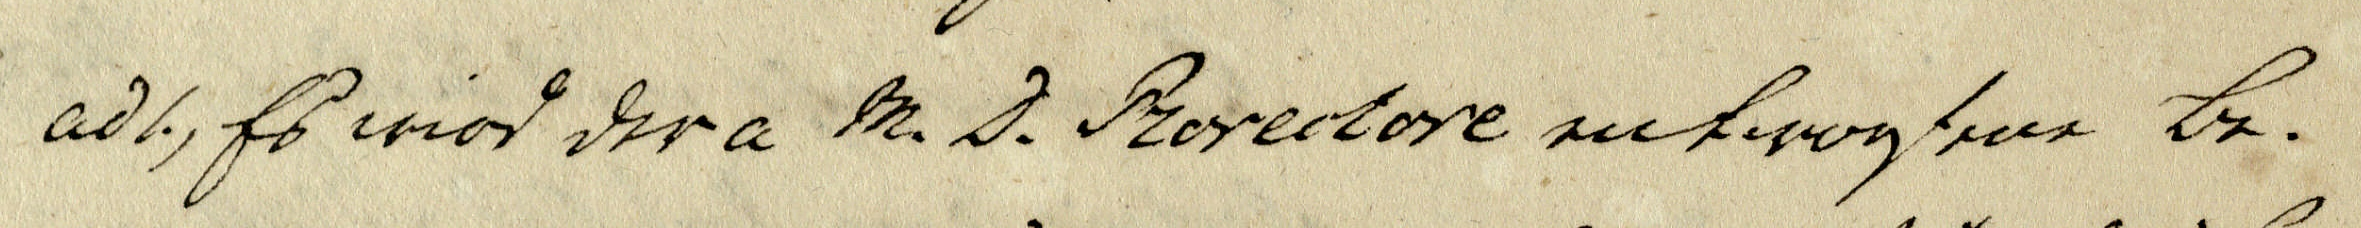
ad 1., Es wird der a M. D. Prorectore entworfene Be¬
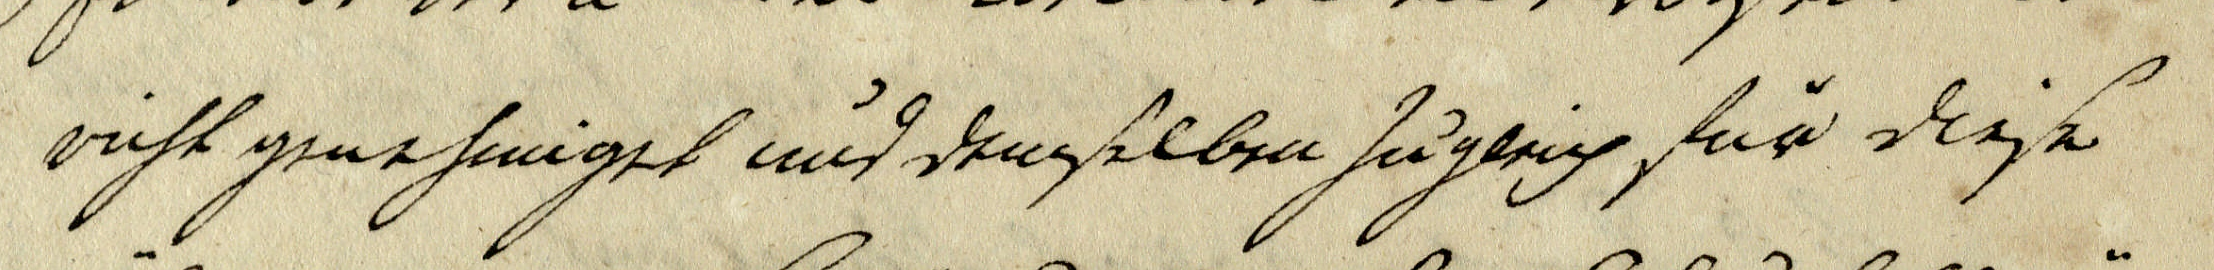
richt genehmiget und demselben zugleich für diese
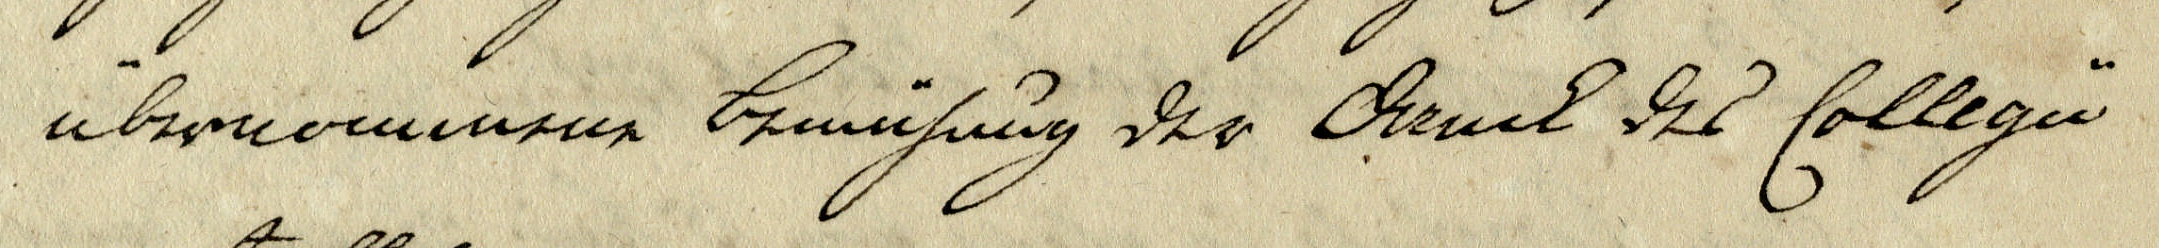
übernommene Bemühung der Danck des Collegii
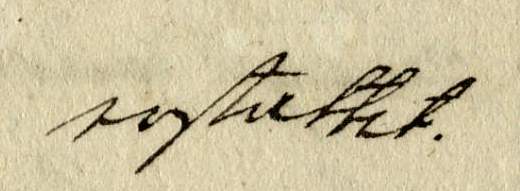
erstattet.
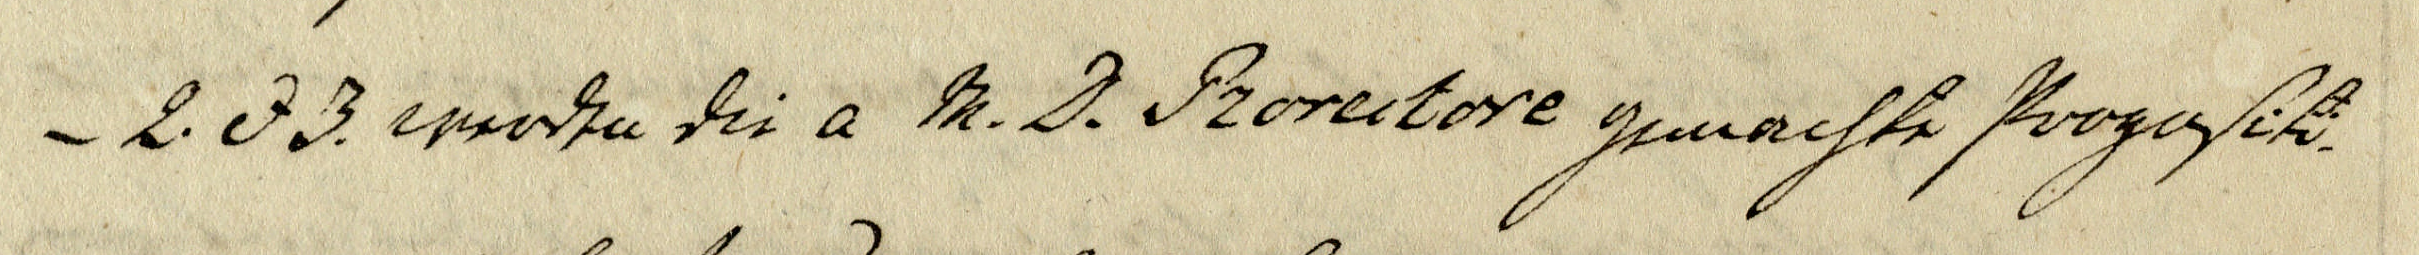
2. et 3. werden die a M. D. Prorectore gemachte Propositi¬
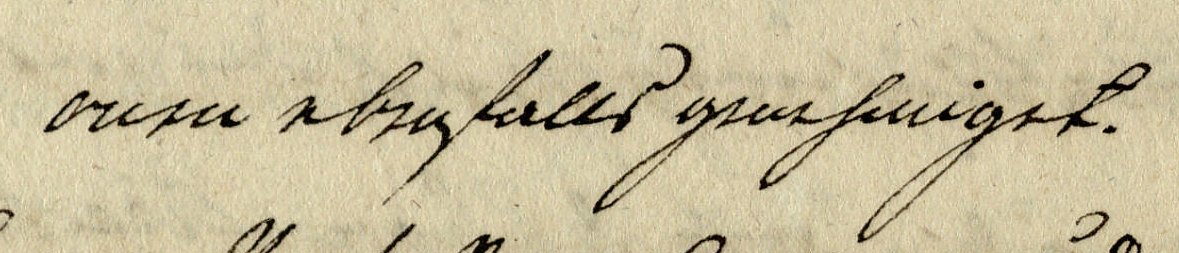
onen ebenfalls genehmiget.
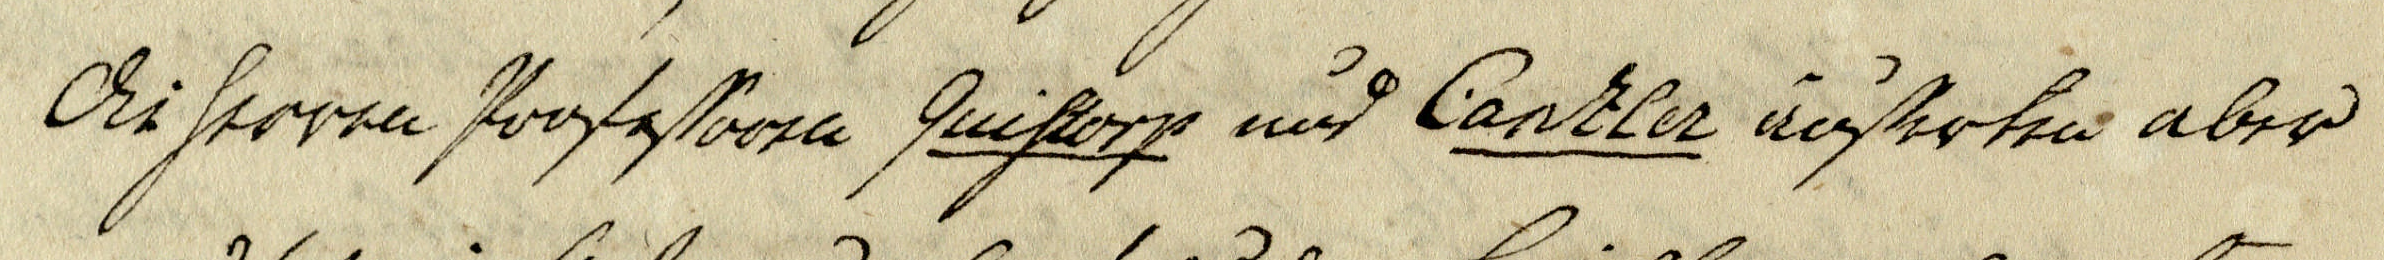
Die Herren Professoren Quistorp und Canzler äusserten aber
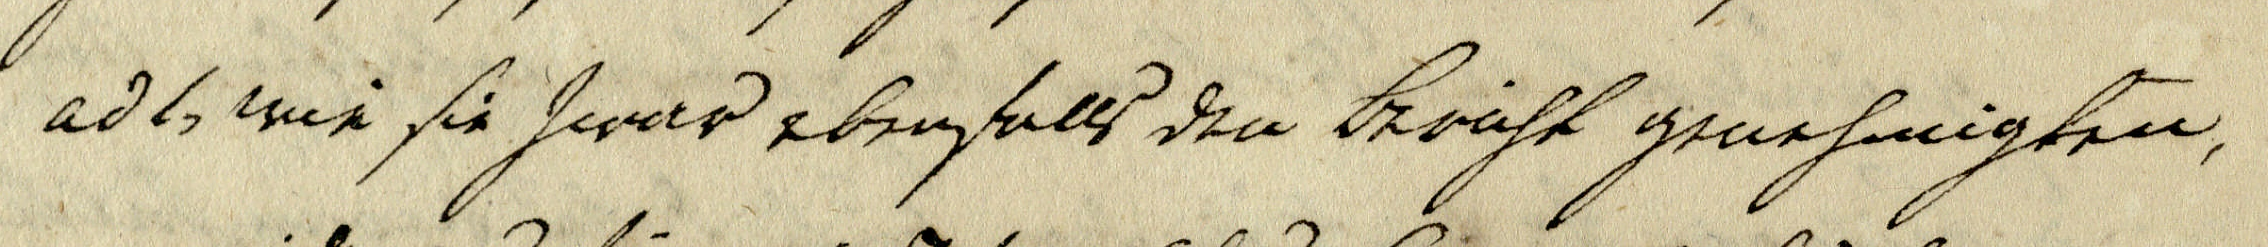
ad 1, wie sie zwar ebenfalls den Bericht genehmigten,
